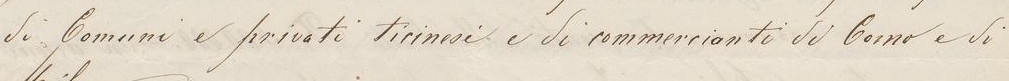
di Comuni e privati ticinesi e di commercianti di Como e di
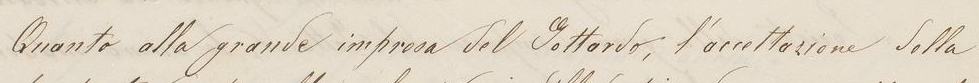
Quanto alla grande impresa del Gottardo, l'accettazione della
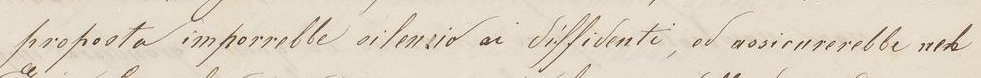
proposta imporrebbe silenzio ai diffidenti, ed assicurerebbe nel
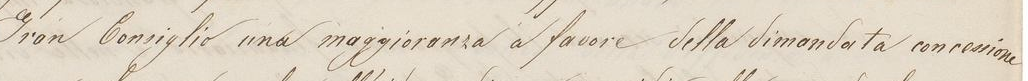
Gran Consiglio una maggioranza a favore della dimandata concessione
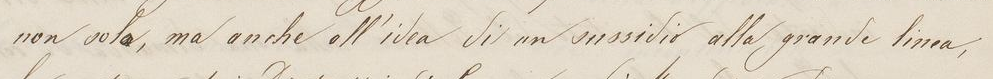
non solo, ma anche all'idea di un sussidio alla grande linea,
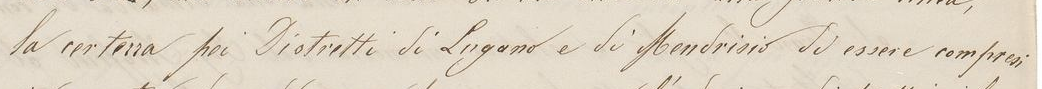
la certezza poi Distretti di Lugano e di Mendrisio di essere compresi
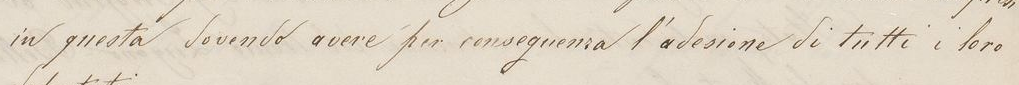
in questa dovendo avere per consequenza l'adesione di tutti i loro
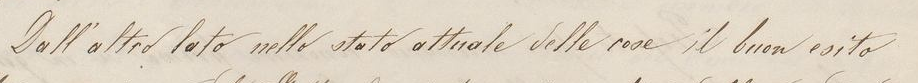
Dall'altro lato nello stato attuale delle cose il buon esito
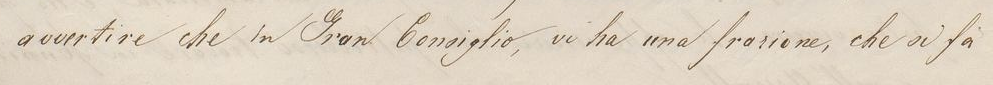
avvertire che in Gran Consiglio, ci ha una frazione, che si fa
